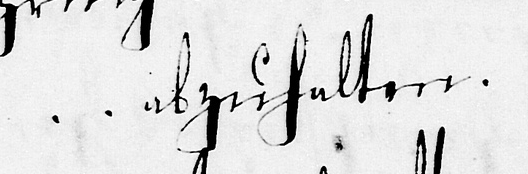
… abzuhalten.
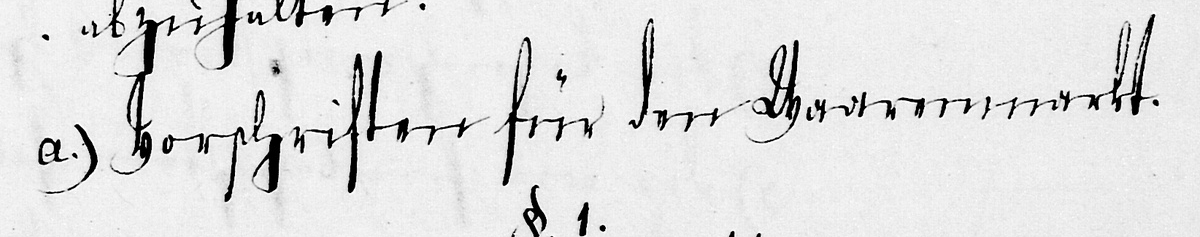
a.) Vorschriften für den Waarenmarkt.
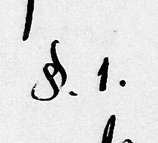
§. 1.
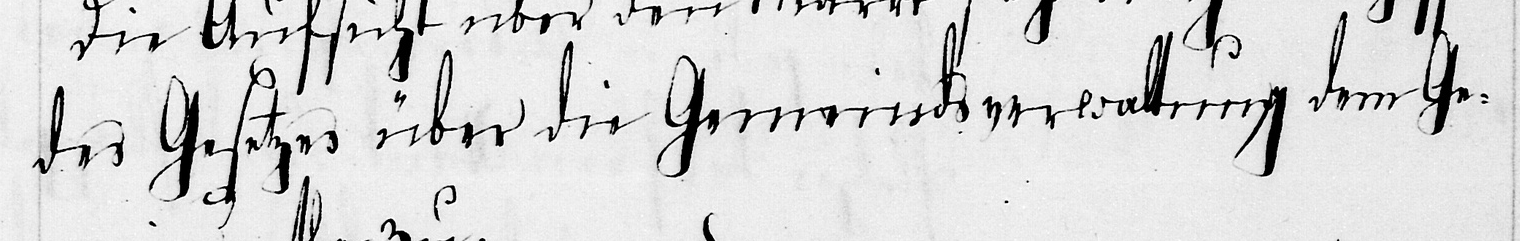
des Gesetzes über die Gemeindsverwaltung dem Ge¬
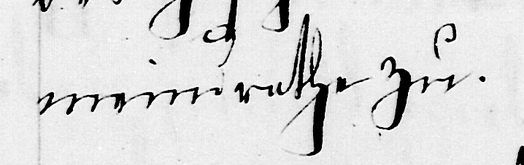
meindrathe zu.
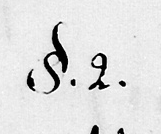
§. 2.
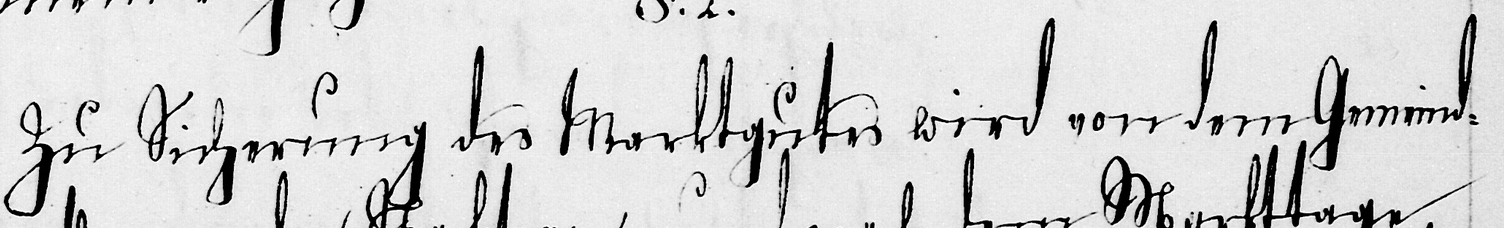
Zu Sicherung des Marktgutes wird von dem Gemeind¬
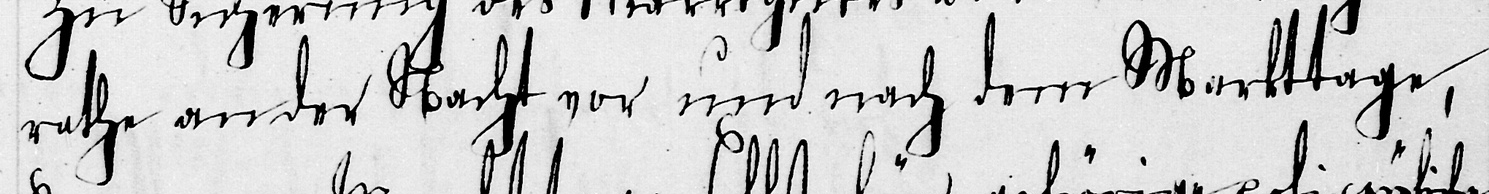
rathe an der Nacht vor und nach dem Markttage,
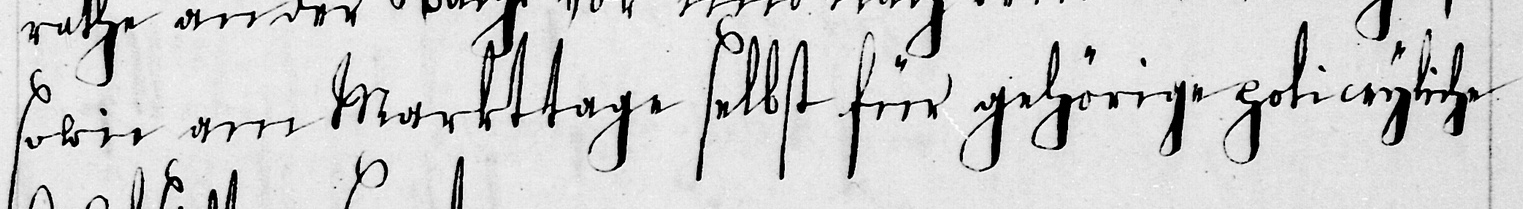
sowie am Markttage selbst für gehörige policeyliche
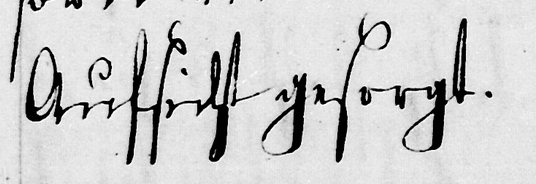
Aufsicht gesorgt.
